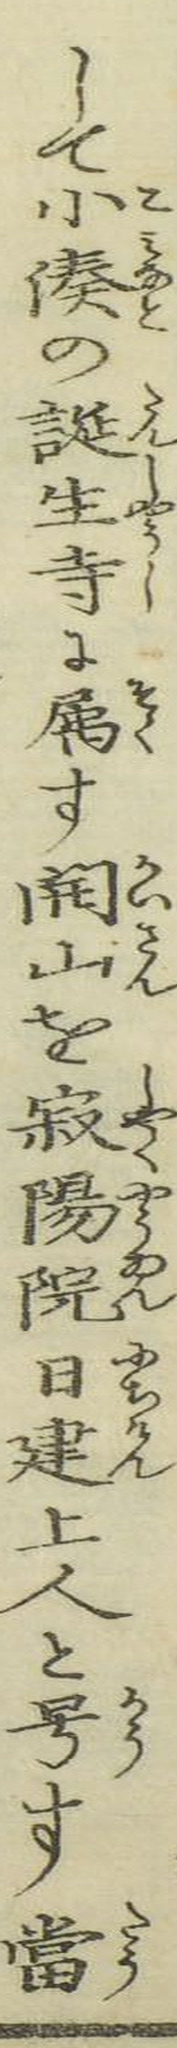して小湊の誕生寺に属す開山を寂陽院日建上人と号す当
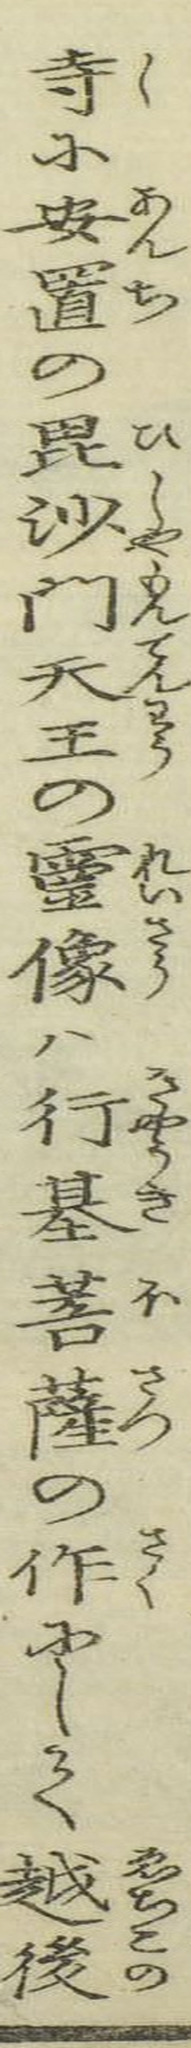寺に安置の毘沙門天王の霊像は行基菩薩の作にして越後
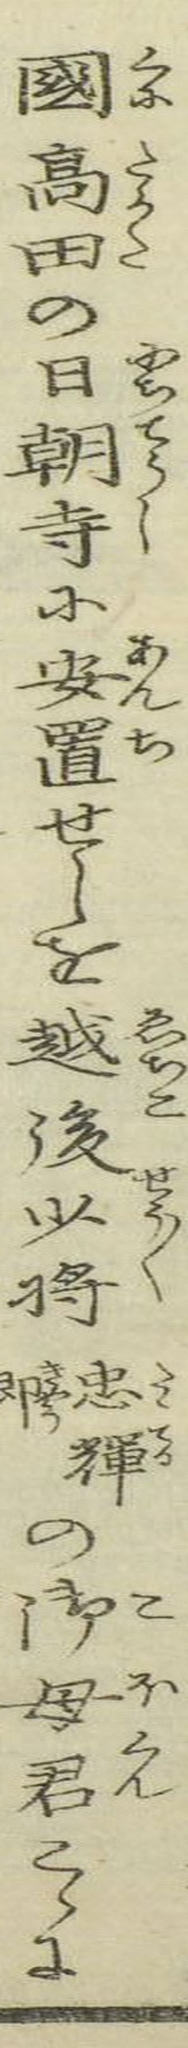国高田の日朝寺に安置せしを越後少将忠輝卿の御母君こゝに
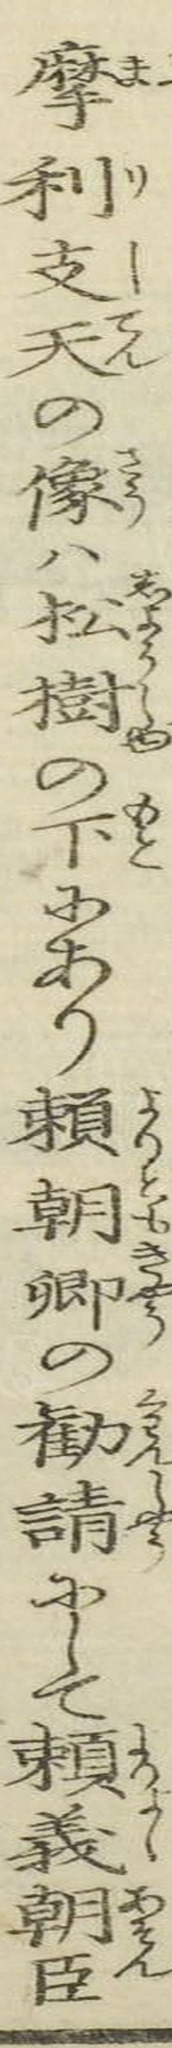摩利支天の像は松樹の下にあり頼朝卿の勧請にして頼義朝臣
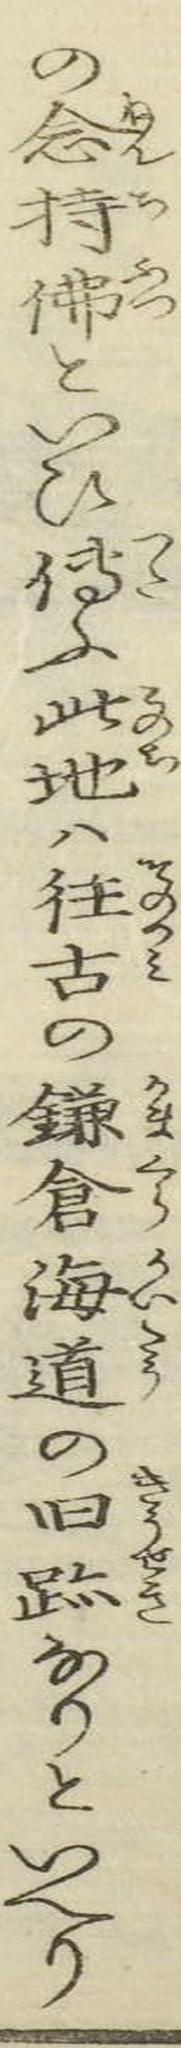の念持仏といひ伝ふ此地は往古の鎌倉海道の旧跡なりといへり
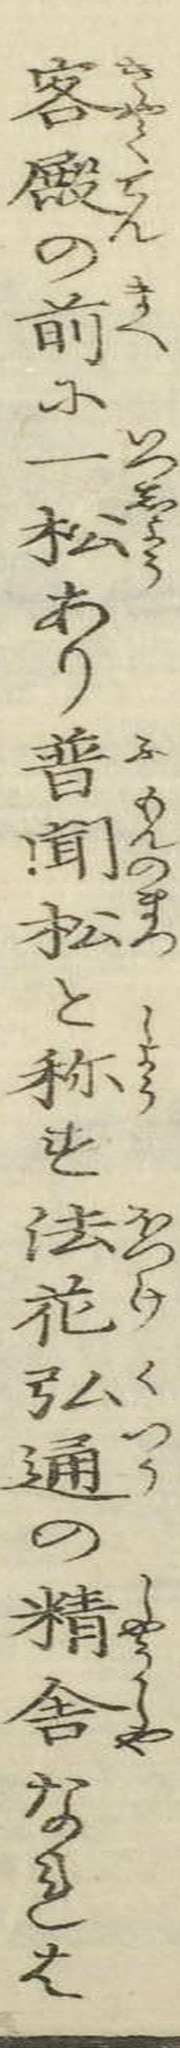客殿の前に一松あり普聞松と称す法花弘通の精舎なれは
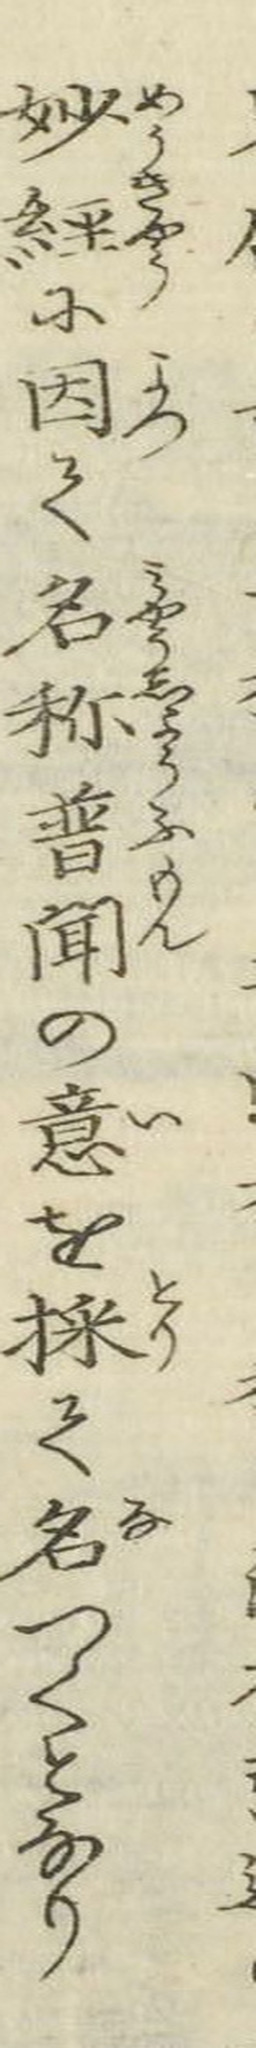妙経に因て名称普聞の意を採て名つくとなり
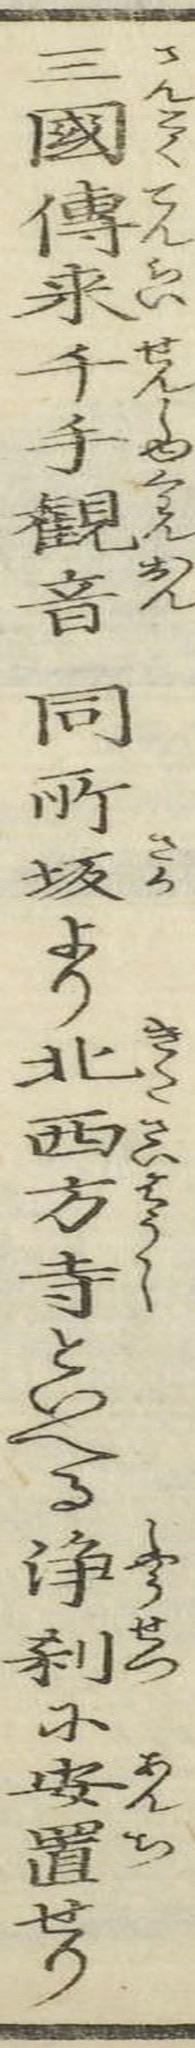三国伝来千手観音同所坂より北西方寺といへる浄刹に安置せり
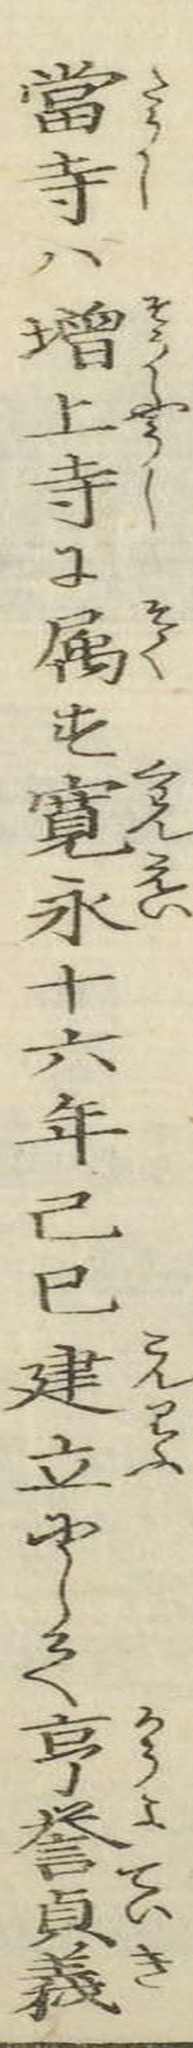当寺は増上寺に属す寛永十六年己巳建立にして享誉貞義
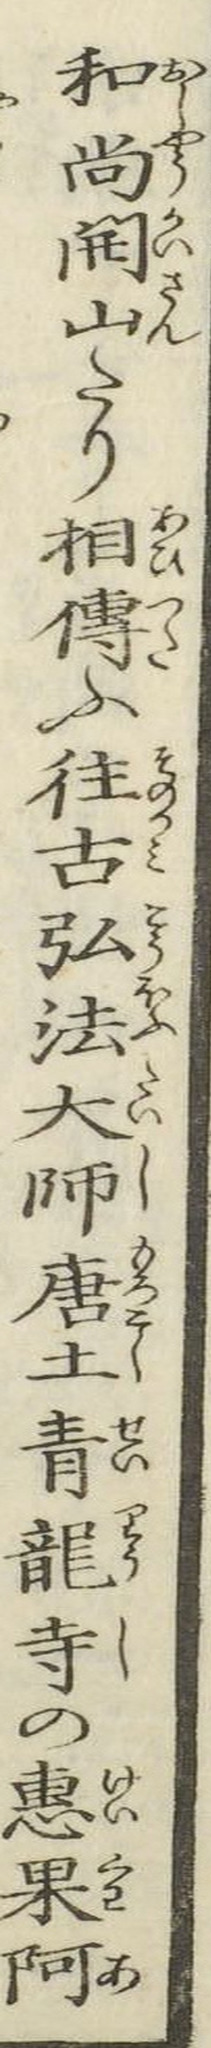和尚開山たり相伝ふ往古弘法大師唐土青竜寺の惠果阿
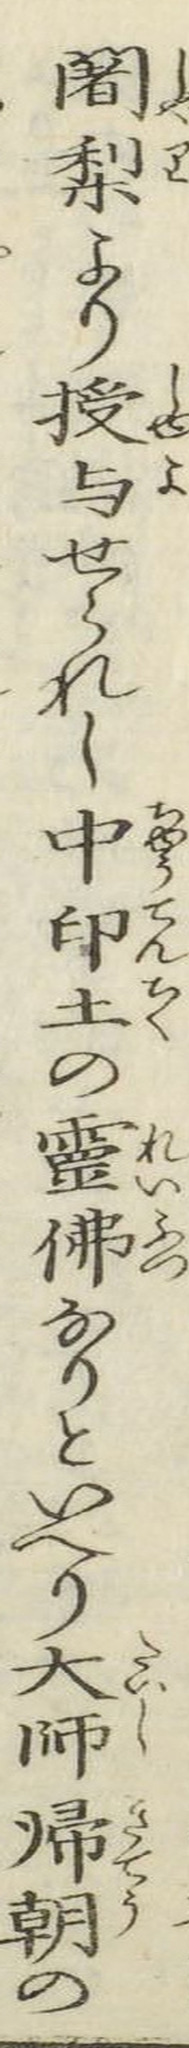闍梨より授与せられし中印土の霊仏なりといへり大師帰朝の
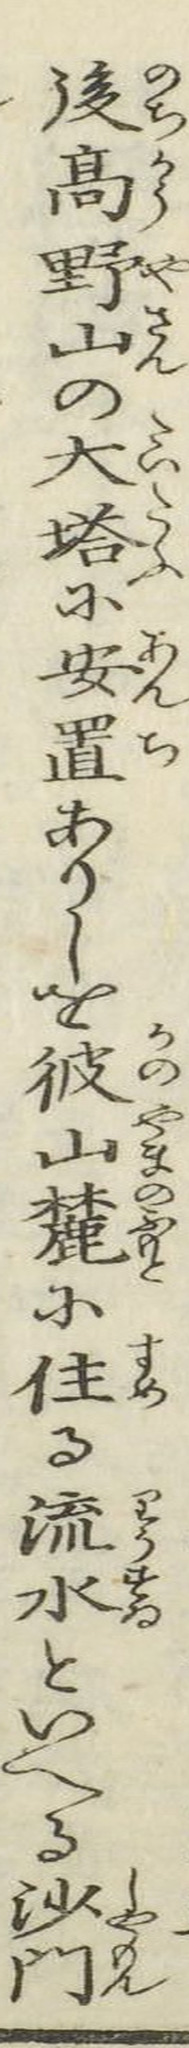後高野山の大塔に安置ありしを彼山麓に住る流水といへる沙門
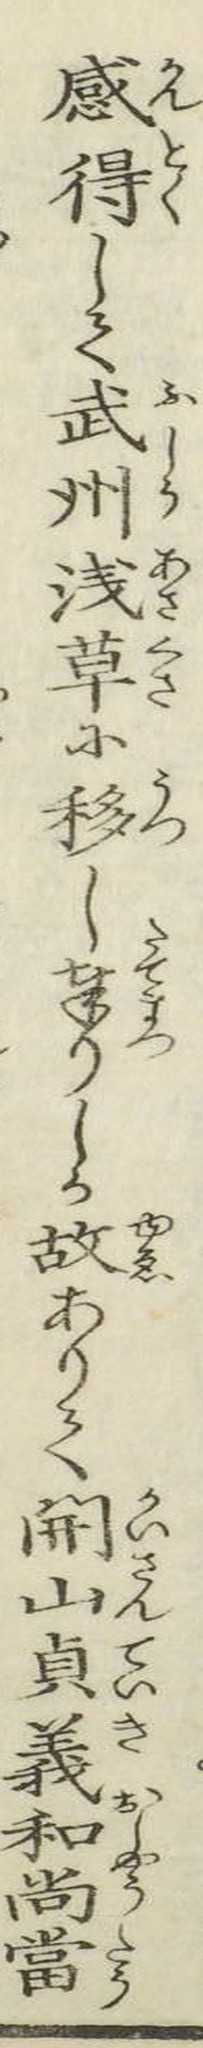感得して武州浅草に移し奉りしか故ありて開山貞義和尚当
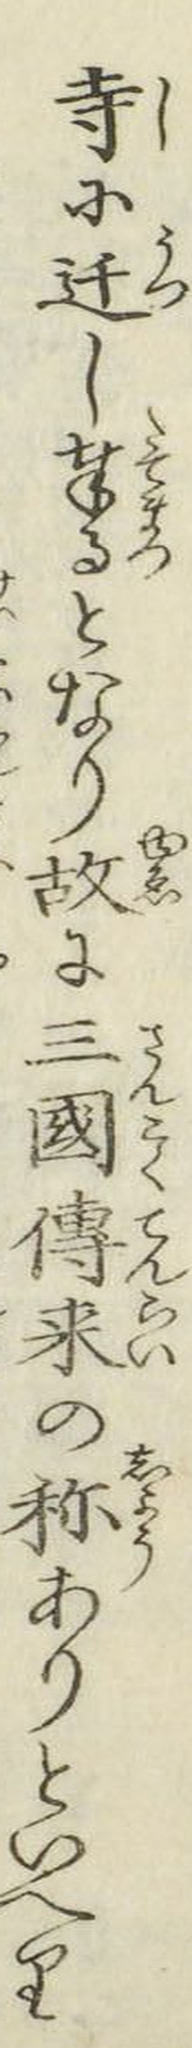寺に遷し奉るとなり故に三国伝来の称ありといへり
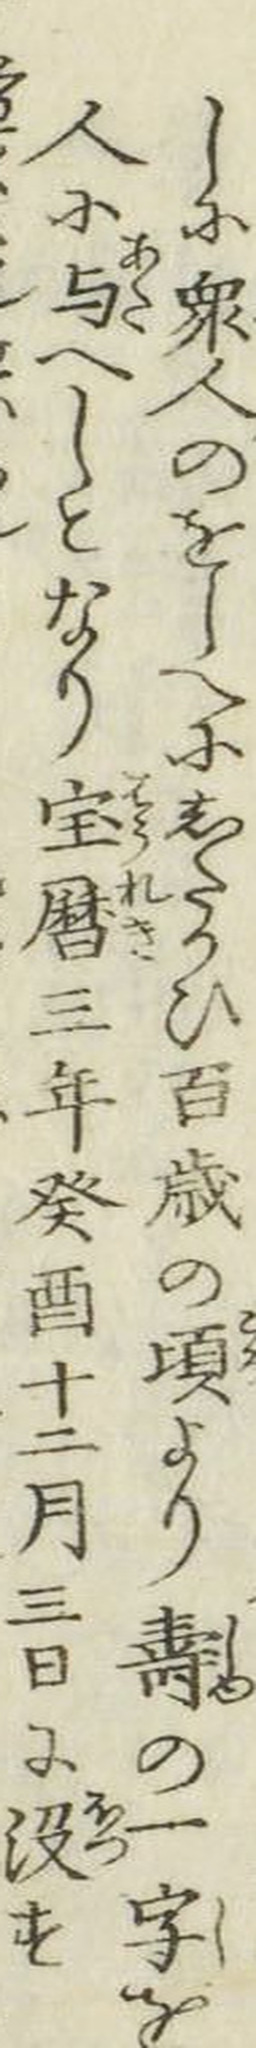人に与へしとなり宝暦三年癸酉十二月三日に没す
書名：江戸名所図会 20巻 巻之11
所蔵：東京学芸大学教育コンテンツアーカイブ
